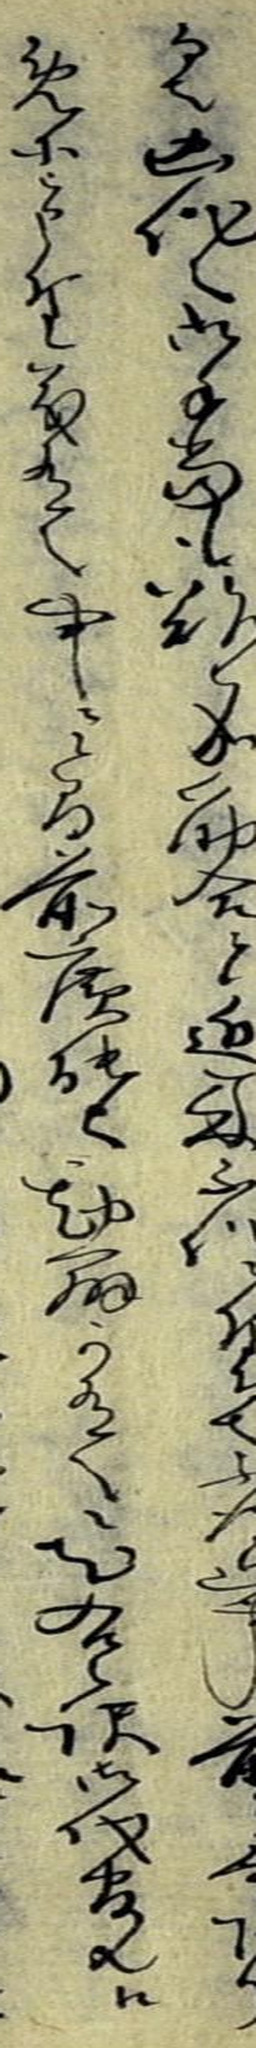免等被申付候義有之事に候間前広能々勘弁可有之候尤右之訳御代官共え
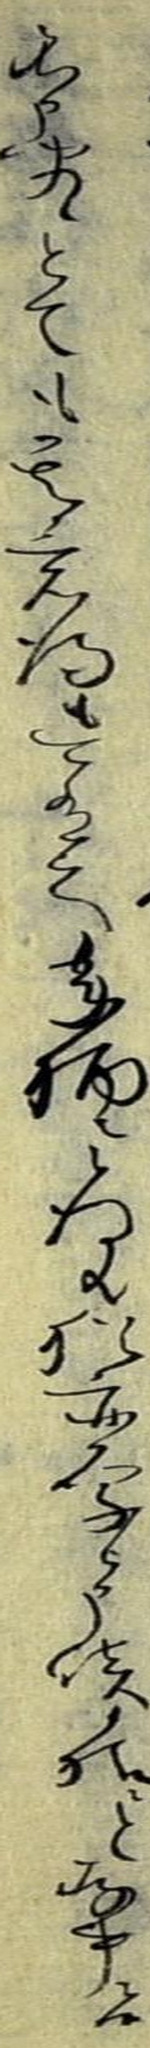不申聞候とても其意得も可有之年柄に候得共猶亦厚被申談候様にと存事に候
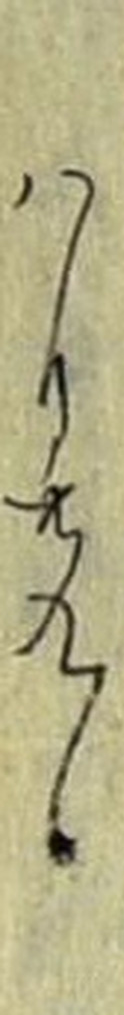八月廿九日

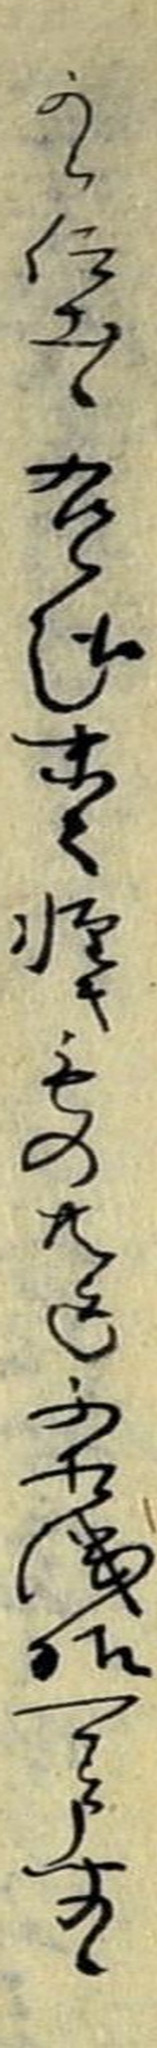可被仰出候右之趣末々軽きもの共迄不相洩様可被申聞候
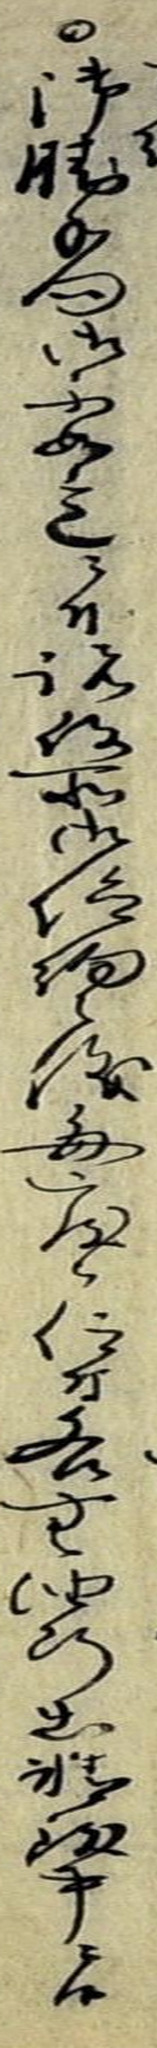〇御勝手向御不如意に付諸役所御倹約之儀毎度被仰付各無油断出精致事に候
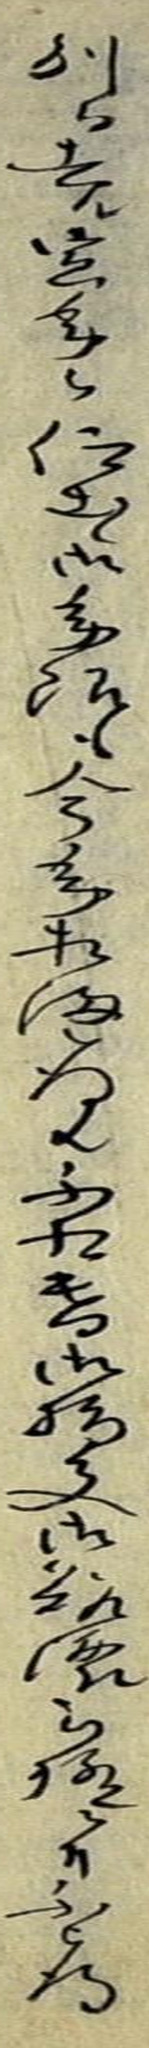別而去る寅年被仰出候御年限も今年相満候得共不相暮御指支御難渋至極に付不被得
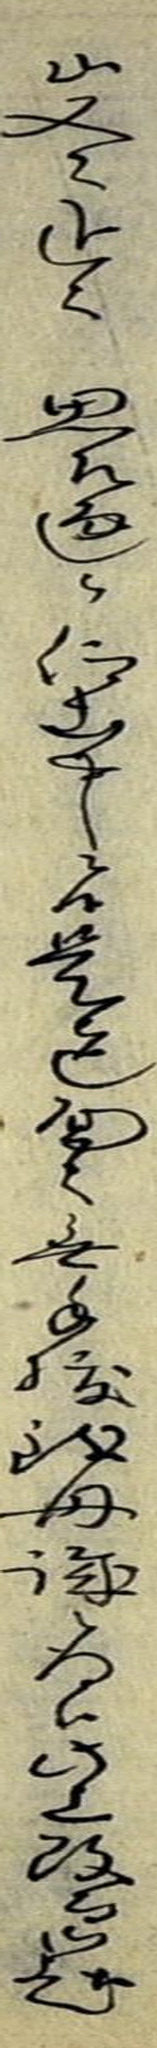止又々追々思召通被仰出事に候是迄面々無手抜致丹誠候得は此上改而御趣
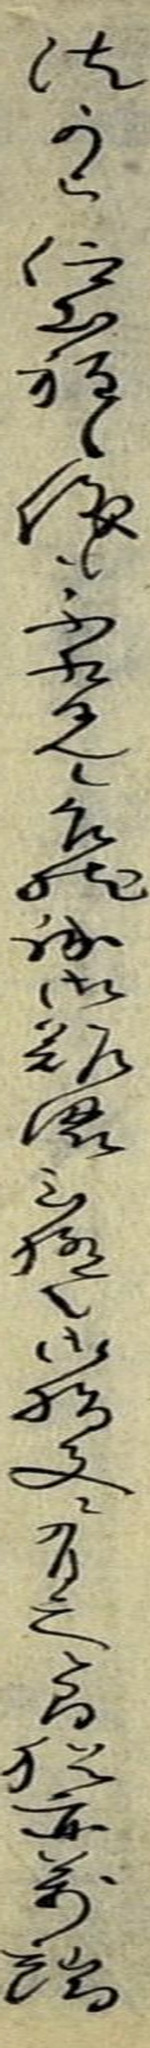法可被仰出程之儀も不相見候乍然誠御難渋至極之御指支に有之候間猶亦万端
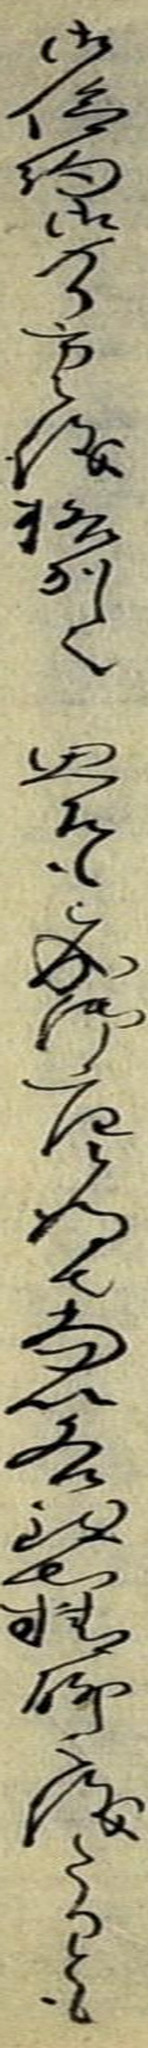御倹約御〆り方之儀格別之思召も被成御座候得は尚以各致出精聊之儀たりとも
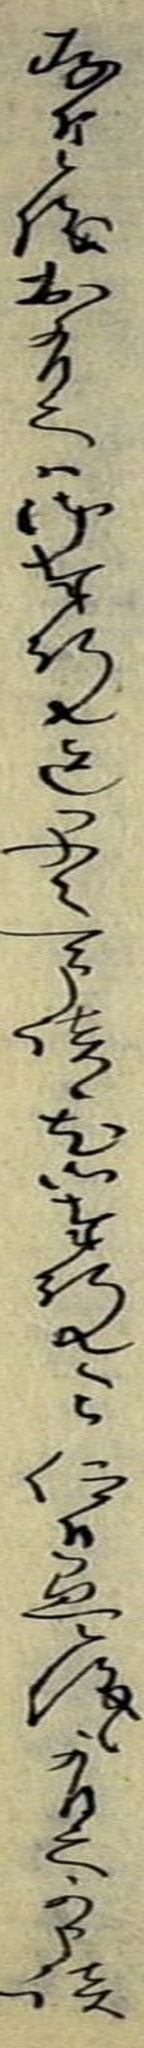存付候儀於有之は御奉行共迄早々可申談候尤御奉行共へ被仰付置候儀も可有之可申談
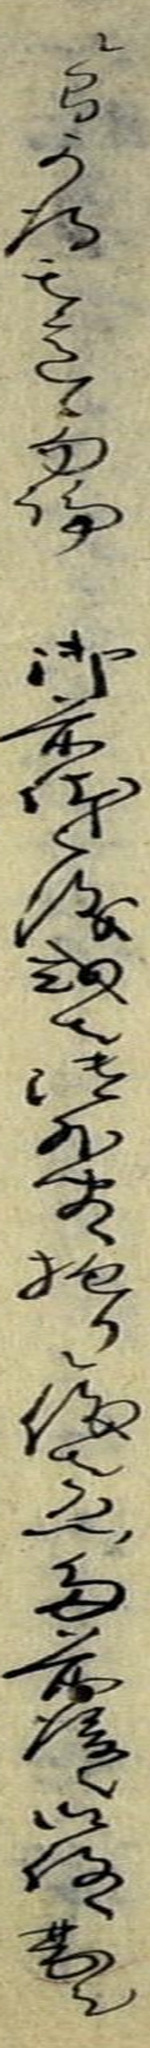候間可得其意候勿論御前体之儀或は御外聞へ拘り候儀は恐多前後之御役へ対し
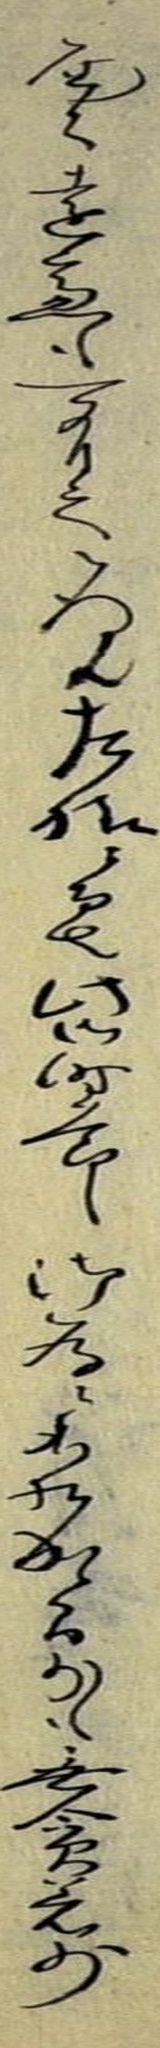面々遠慮も可有之候得共左様に而は此御時節御為に不相成候間少も無貪着少
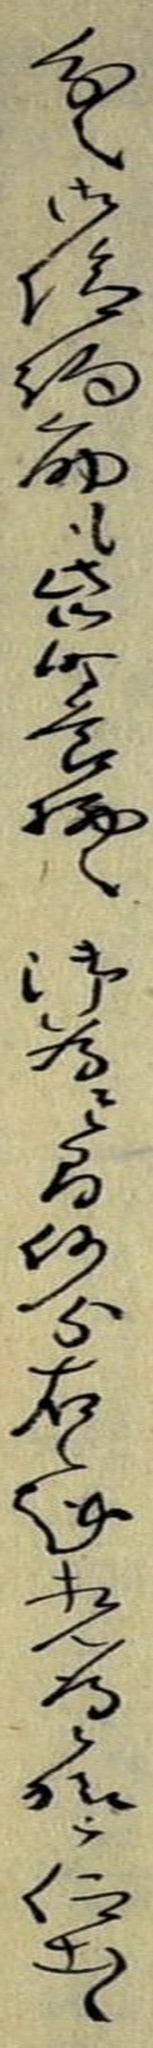分之御倹約筋も此御時節柄之御為に候間何分右之趣相心得候様被仰出候
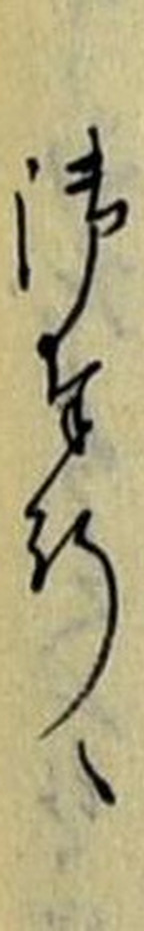御奉行へ
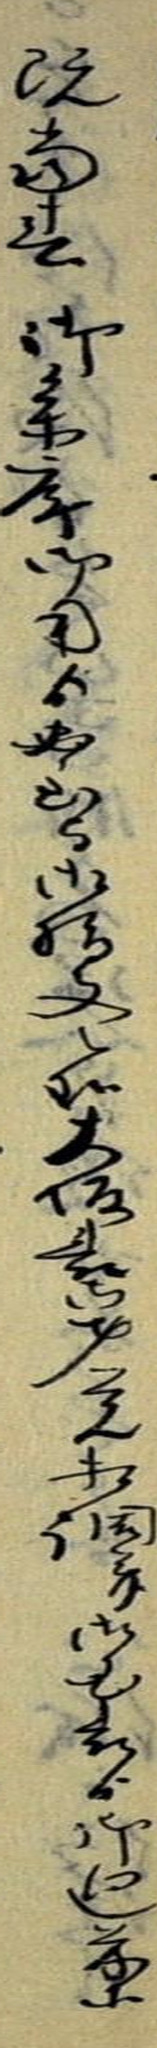既当春御参府御用ゟ必至与御指支之処大坂表御才覚相調并御国表ゟ御廻米等
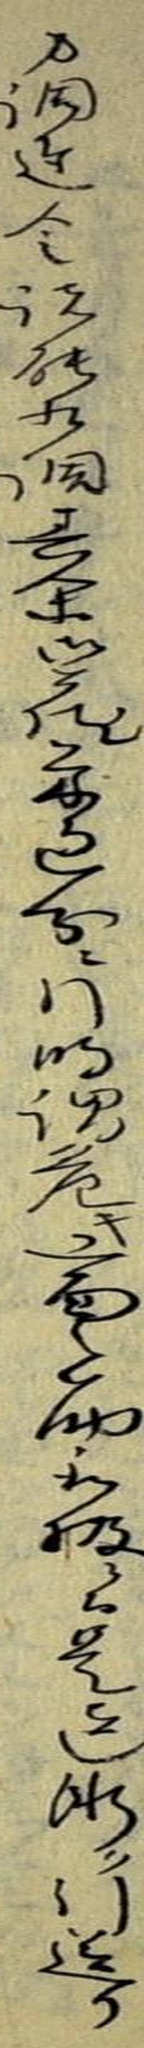方調達金諸能相調其余御蔵米過分に引明謂危き工面之筋取扱に而是迄漸く引送り
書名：命令之部 二
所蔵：福井県文書館 Fukui Prefectural Archives
